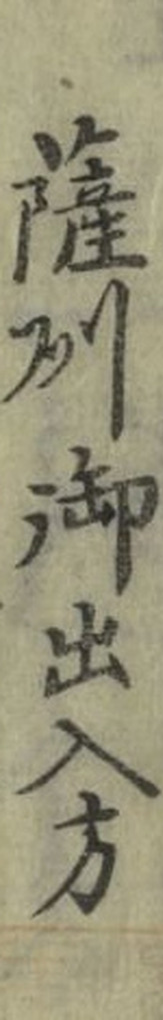薩州御出入方
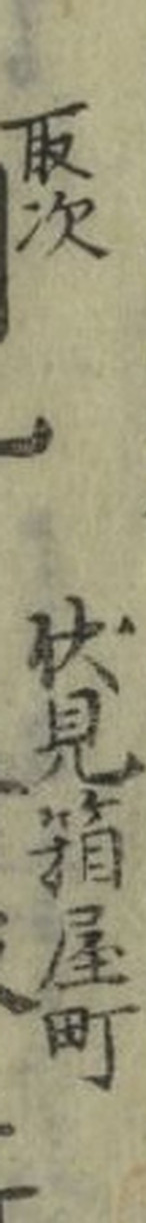取次伏見箱屋町
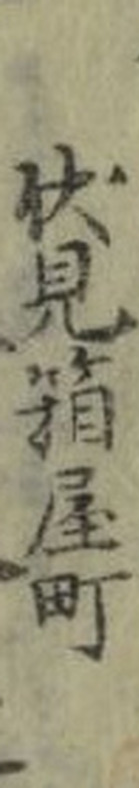取次伏見箱屋町
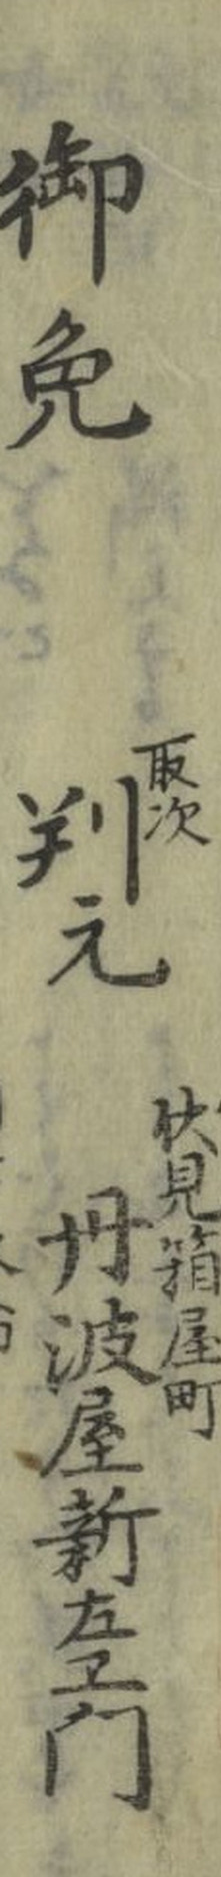御免判元丹波屋新左衛門
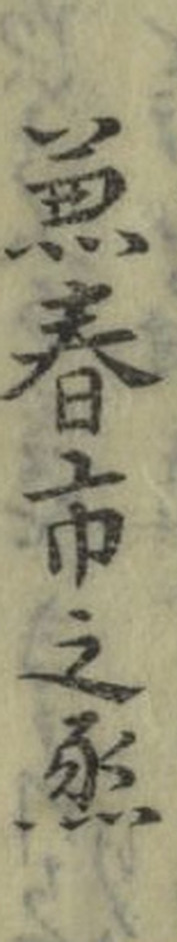兼春市之丞
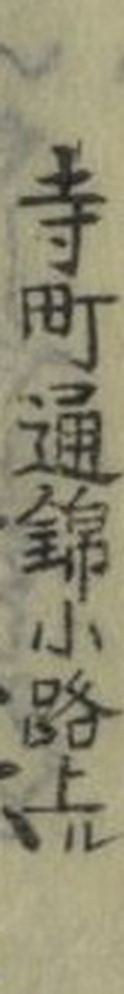寺町通錦小路上ル
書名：琉球人行列記
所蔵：University of the Ryukyus Library
